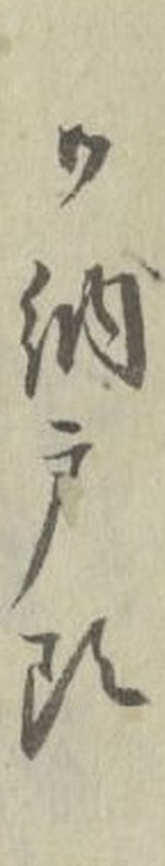御納戸頭
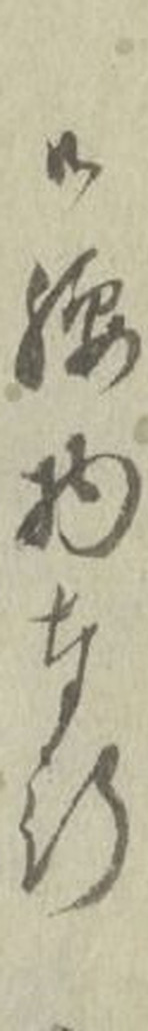御腰物奉行
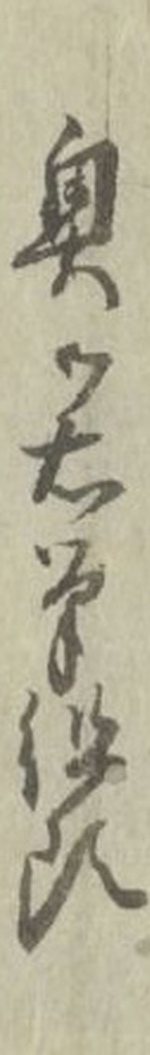奥御右筆組頭

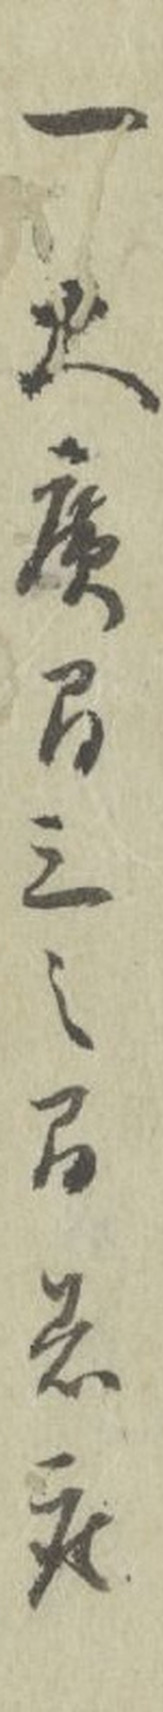一大広間三之間着座
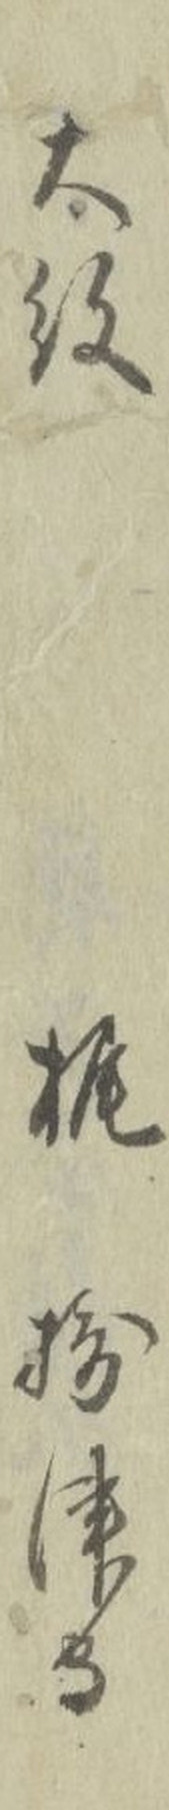大紋梶摂津守
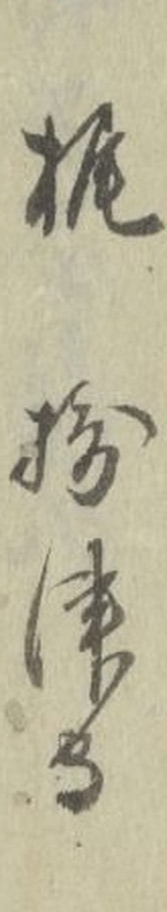大紋梶摂津守
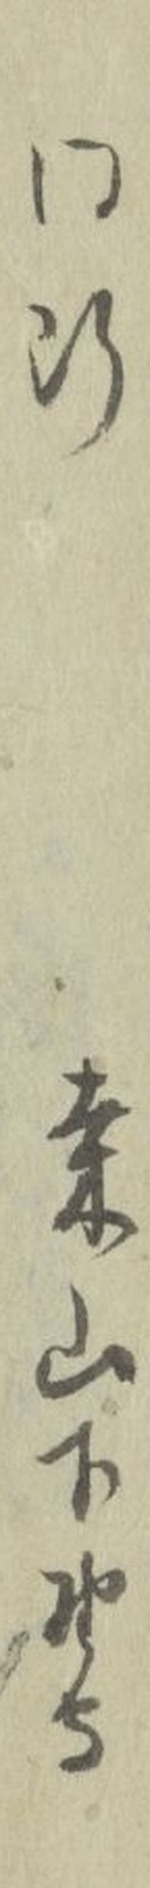同断桑山下野守
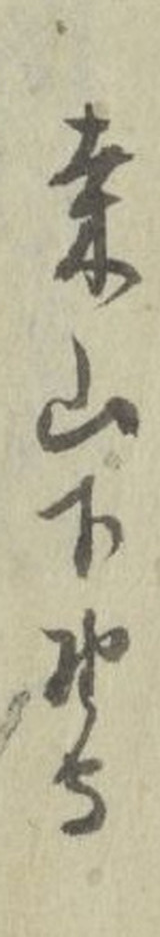同断桑山下野守
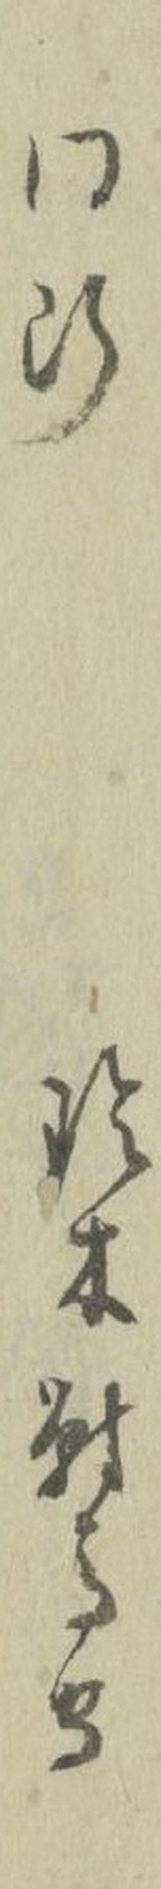同断鈴木対馬守
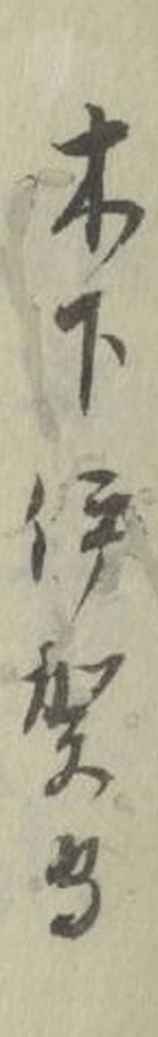同断木下伊賀守
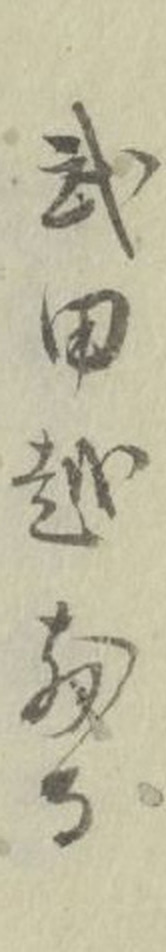同断武田越前守
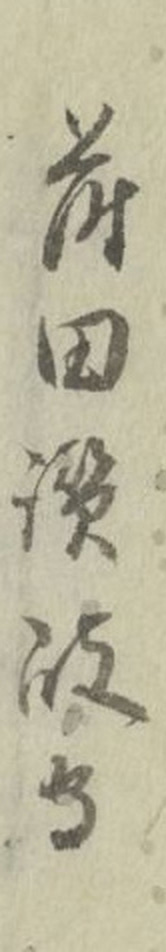同断前田讃岐守
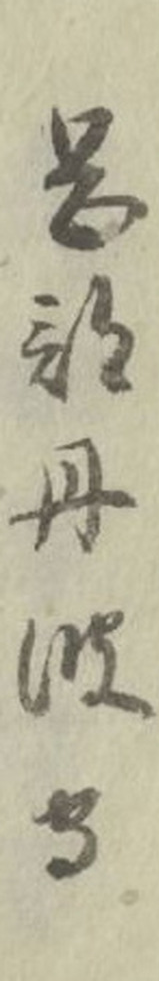同断岡部丹波守

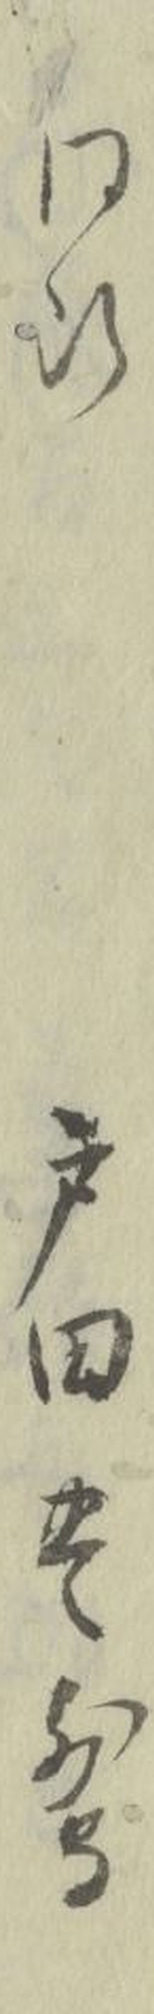同断戸田豊前守
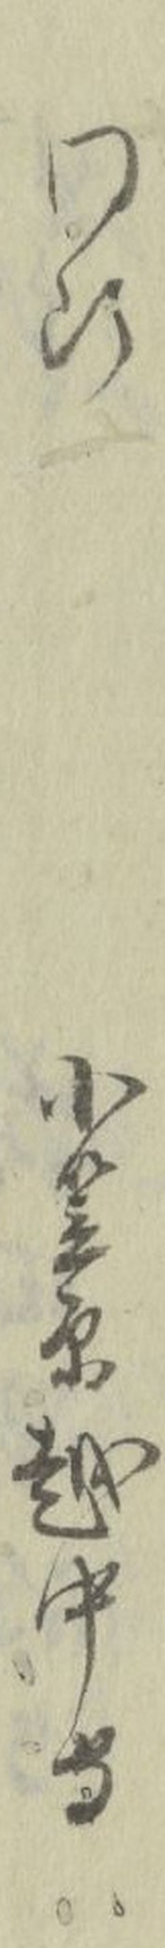同断小笠原越中守
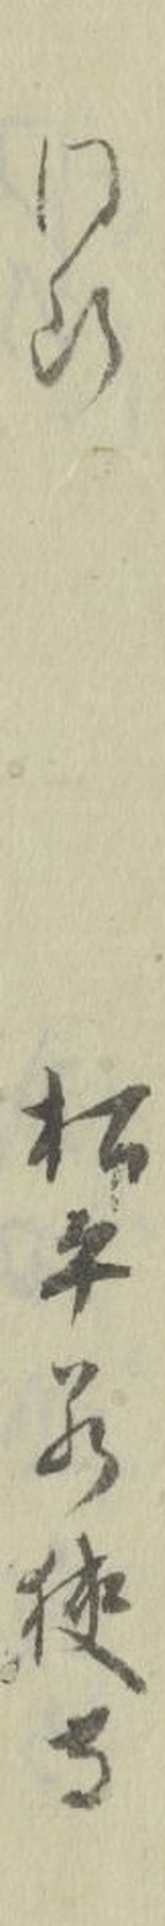同断松平若狭守
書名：琉球来朝記 自一至七
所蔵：University of the Ryukyus Library
